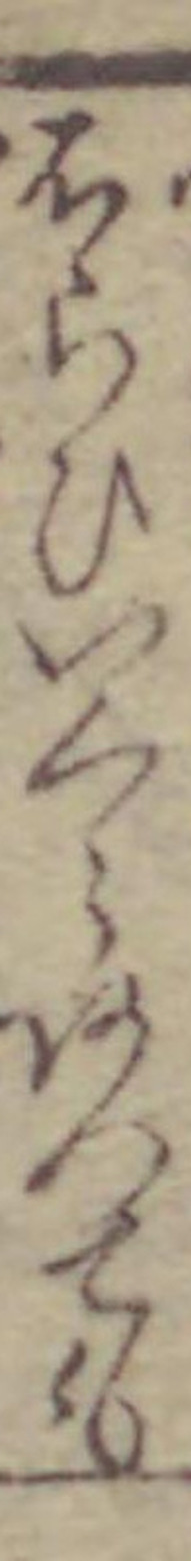はらひいくらあつても
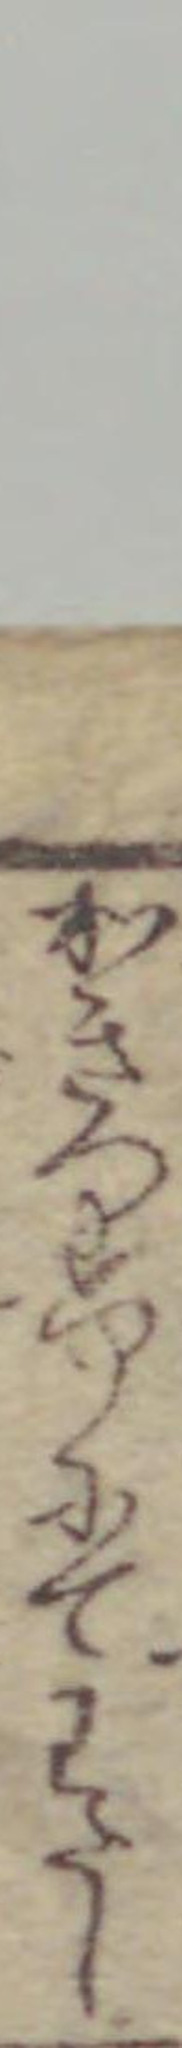かきつけにてわたし
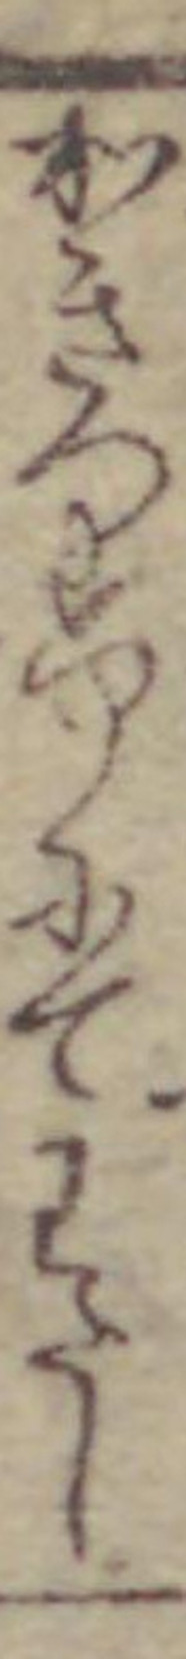かきつけにてわたし
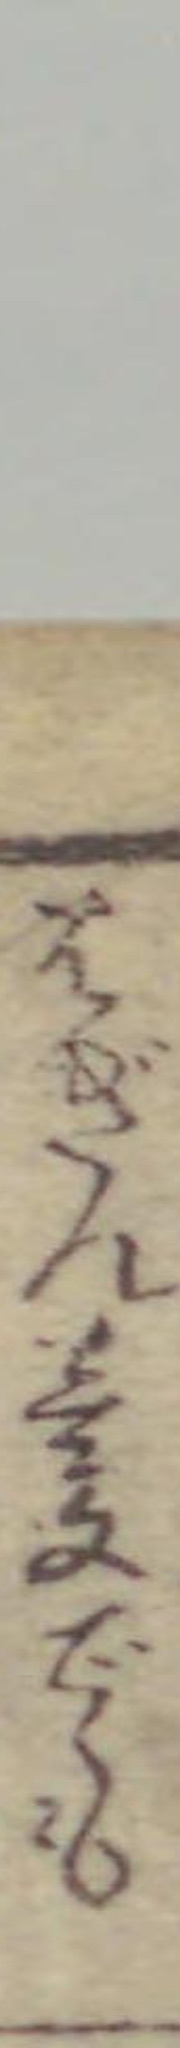はぎん壱文でも
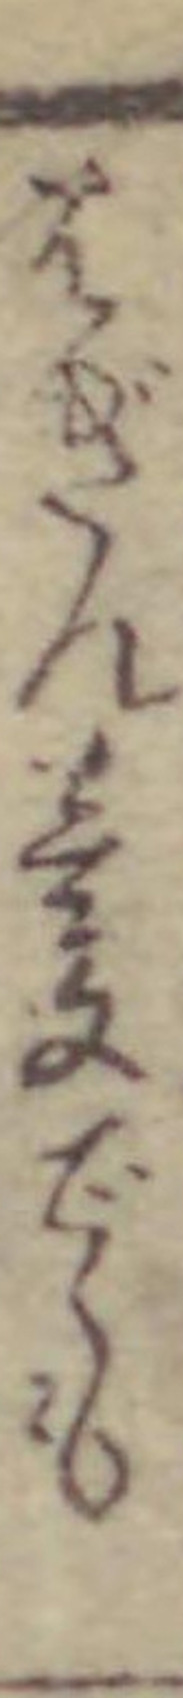はぎん壱文でも
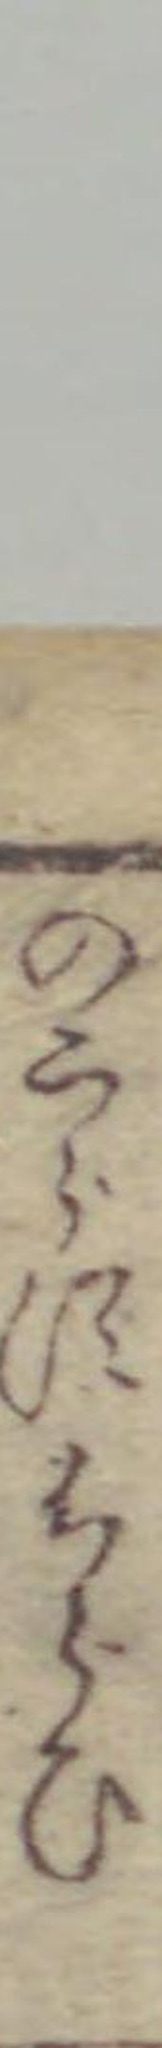のこらすはらひ
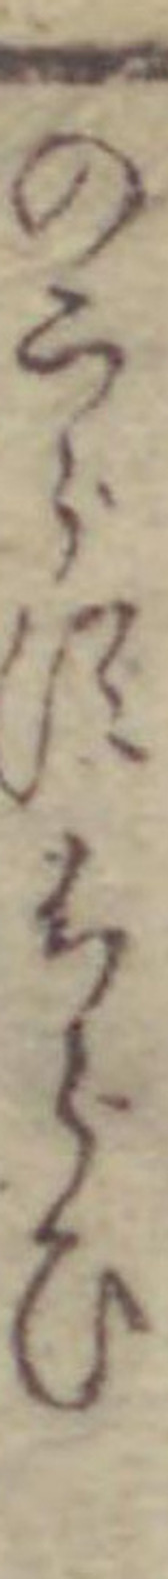のこらすはらひ
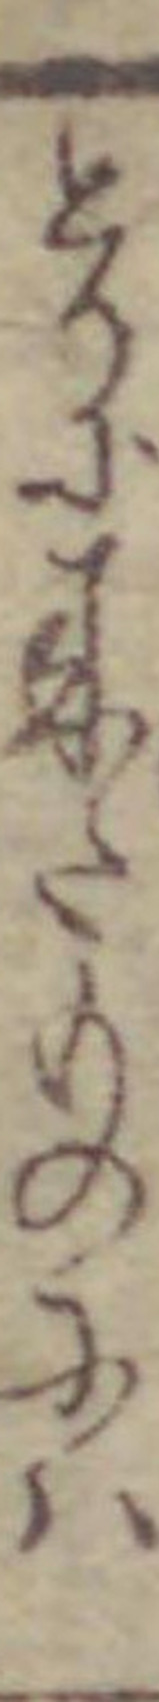とりに来たものには
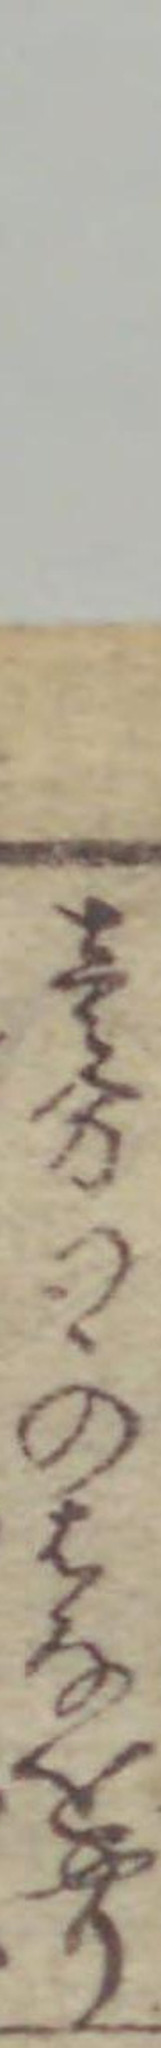壱分つゝのはなをやり
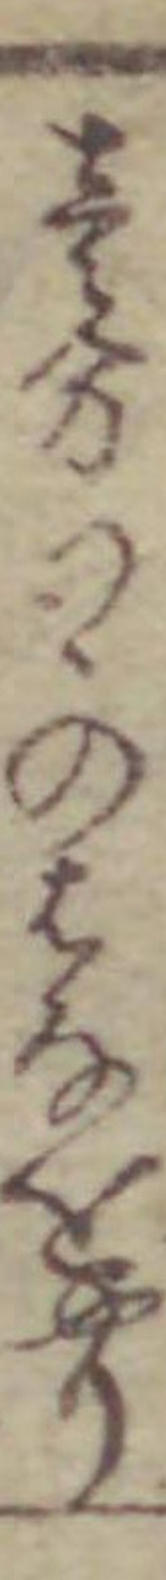壱分つゝのはなをやり
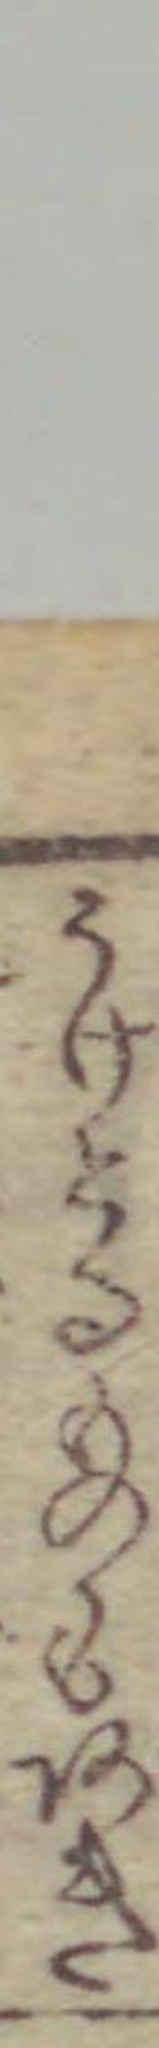うけとるものもあき
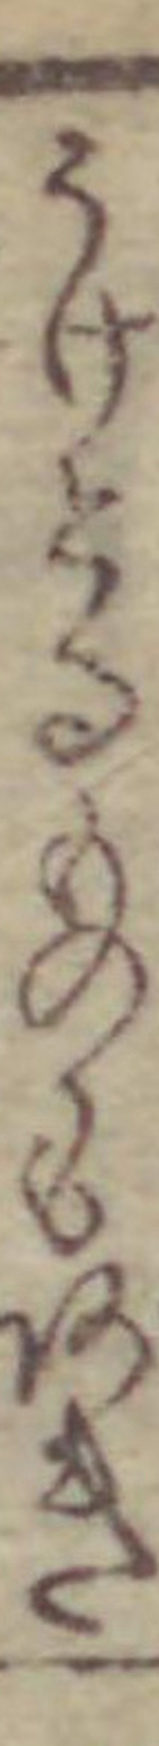うけとるものもあき
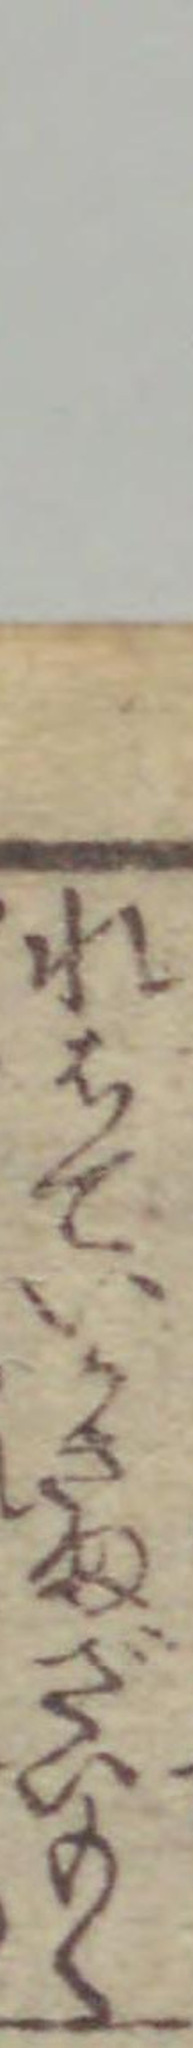れはていかさまざいもく
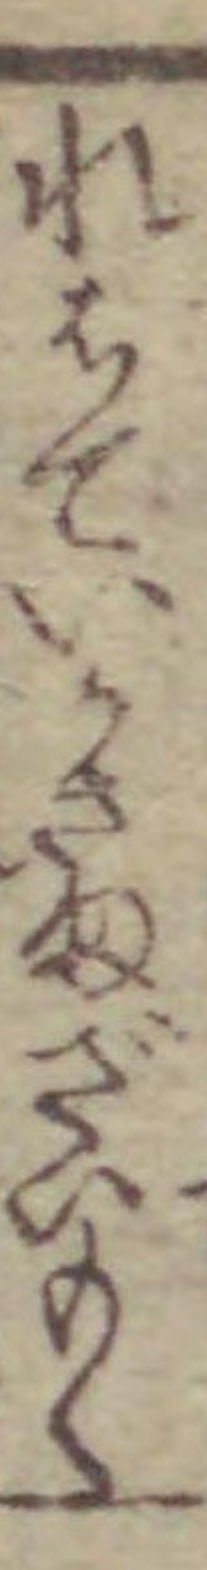れはていかさまざいもく
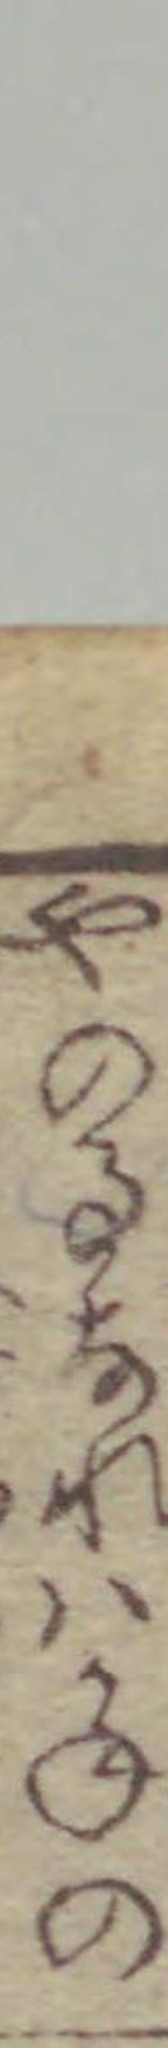やの事なれはかねの
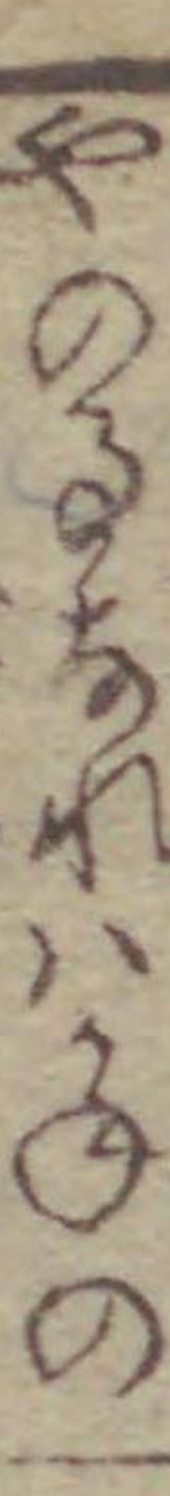やの事なれはかねの
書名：親父布子鳶握 3巻
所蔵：国立国会図書館 National Diet Library, JAPAN
